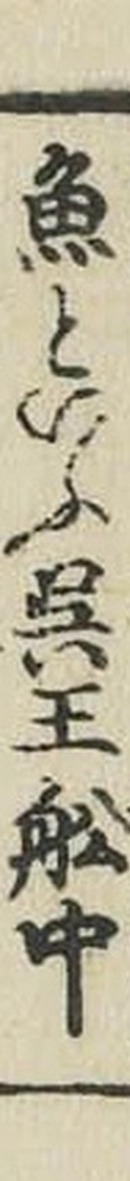魚といふ呉王船中
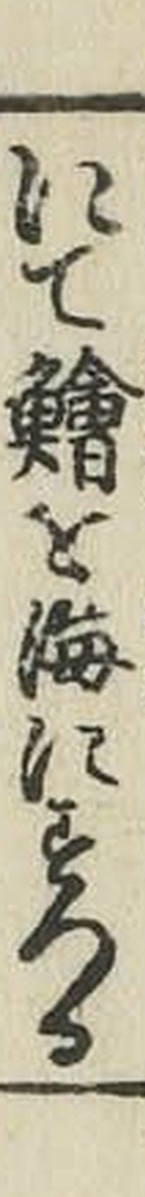にて鱠を海にすつる
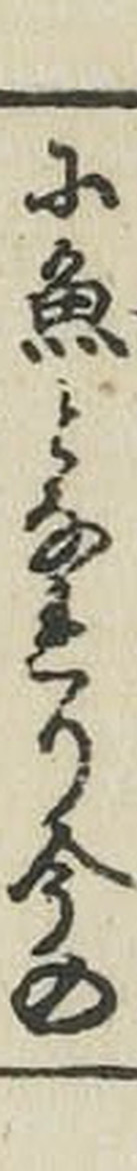に魚となれり今の
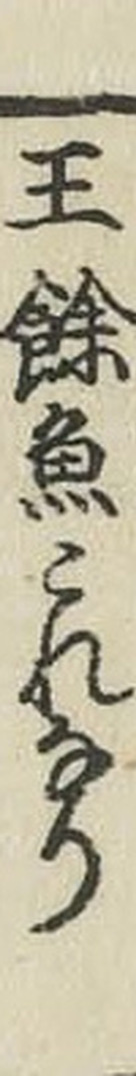王余魚これなり
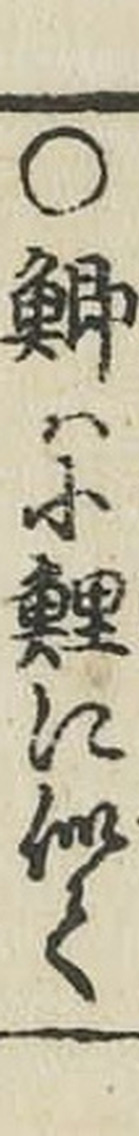○鯽は小鯉に似て
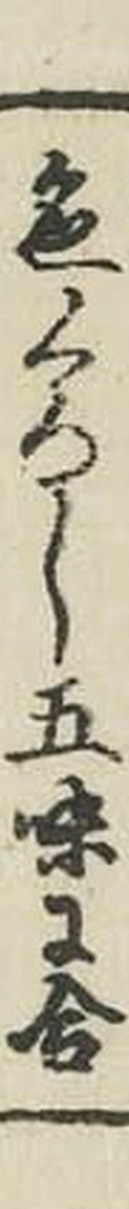色くろし五味に合
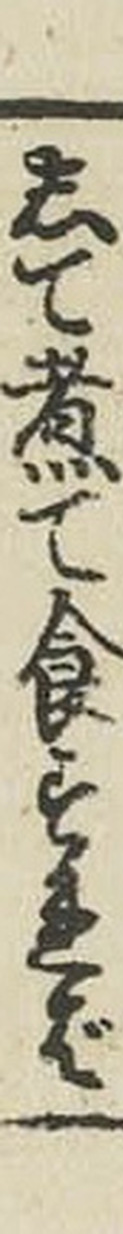して煮て食すれば
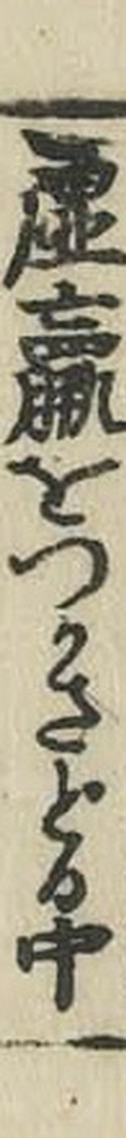虚羸をつかさどる中
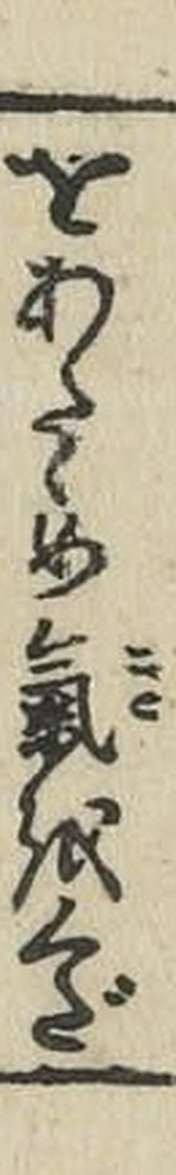をあたゝめ気をくだ
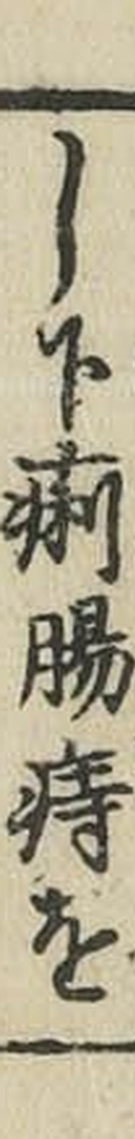し下痢腸痔を
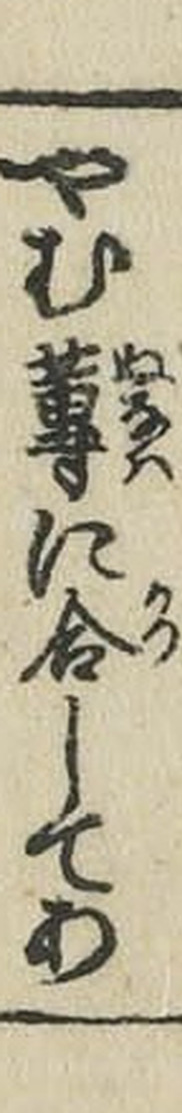やむ蓴に合してあ
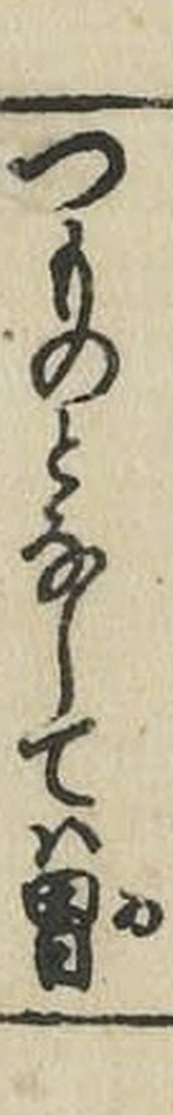つものとなしては胃
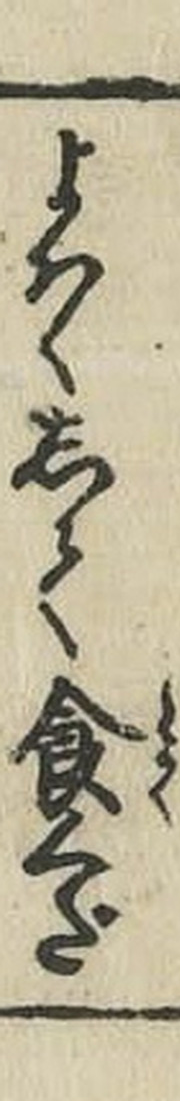よはくして食くだ
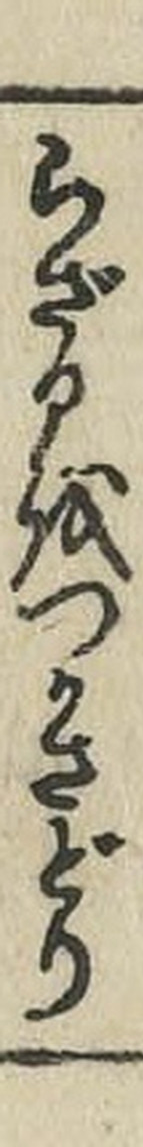らざるをつかさどり
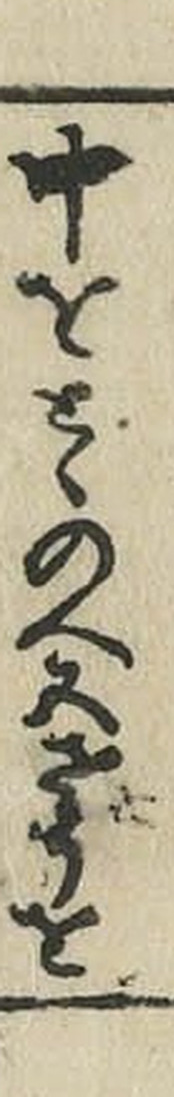中をとゝのへ五ざうを
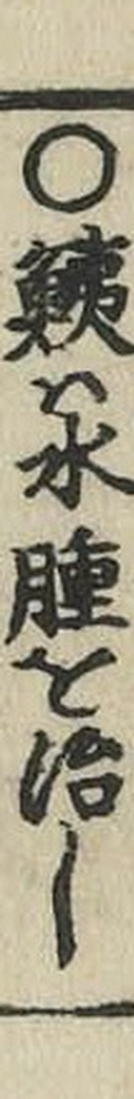○鮧は水腫を治し
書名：増補頭書訓蒙図彙大成 10巻 7:巻之14-16
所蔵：東京学芸大学教育コンテンツアーカイブ
